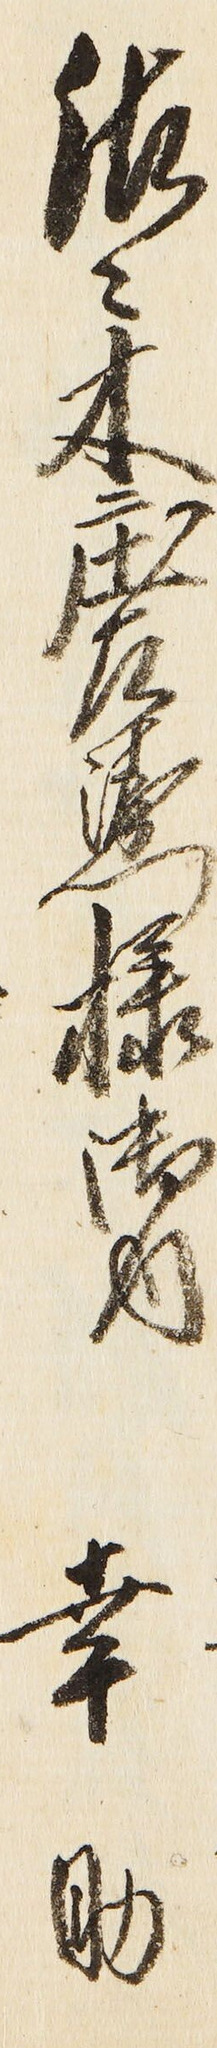佐々木庄左衛門様御内
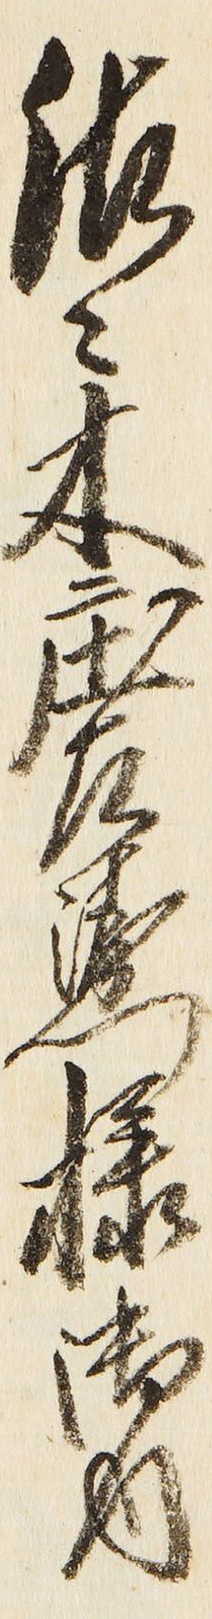佐々木庄左衛門様御内
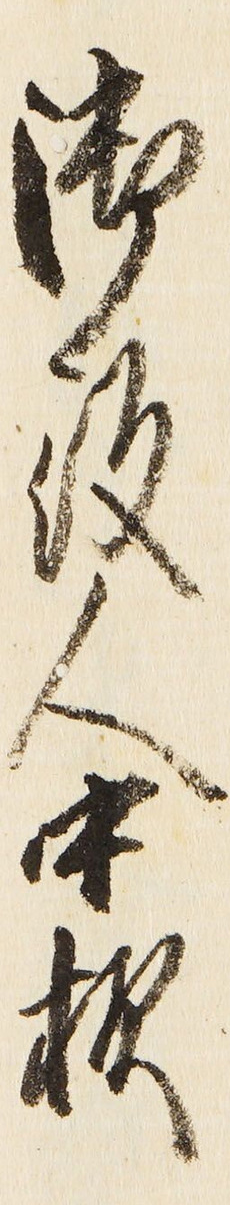御役人中様
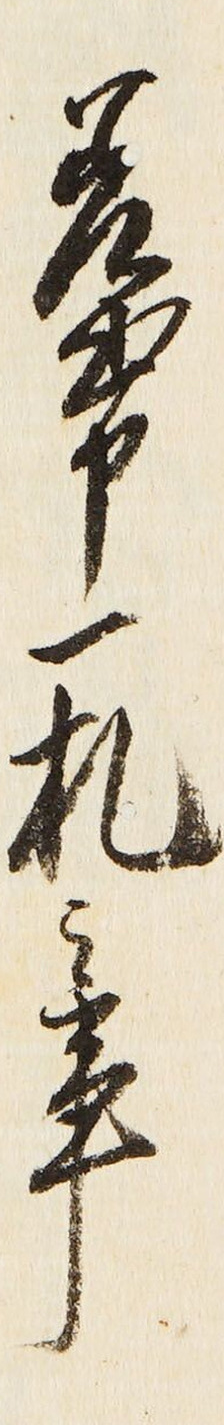差出申一札之事
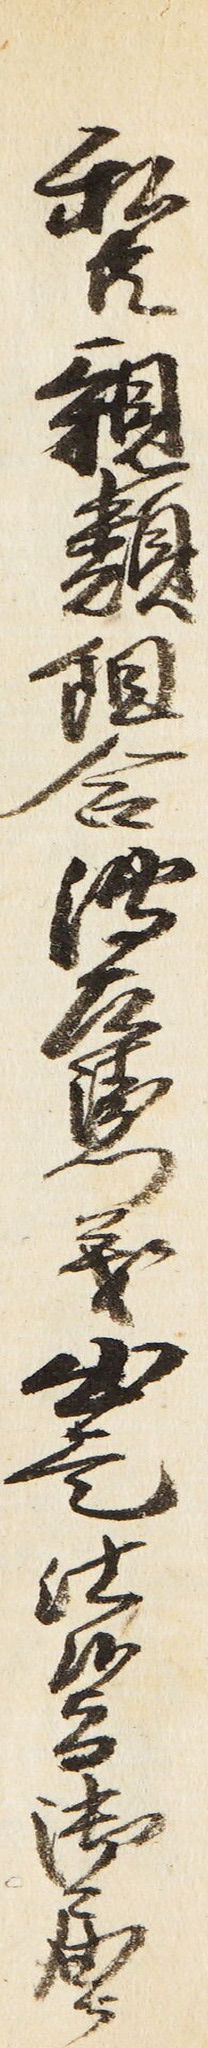一私共親類組合伝左衛門義出走仕候旨御届ケ
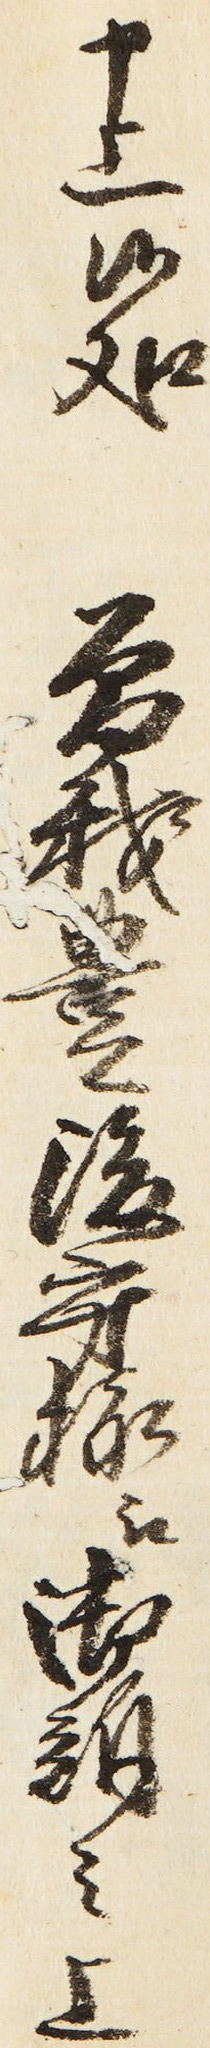申上候処曾我豊後守様江御訴之上
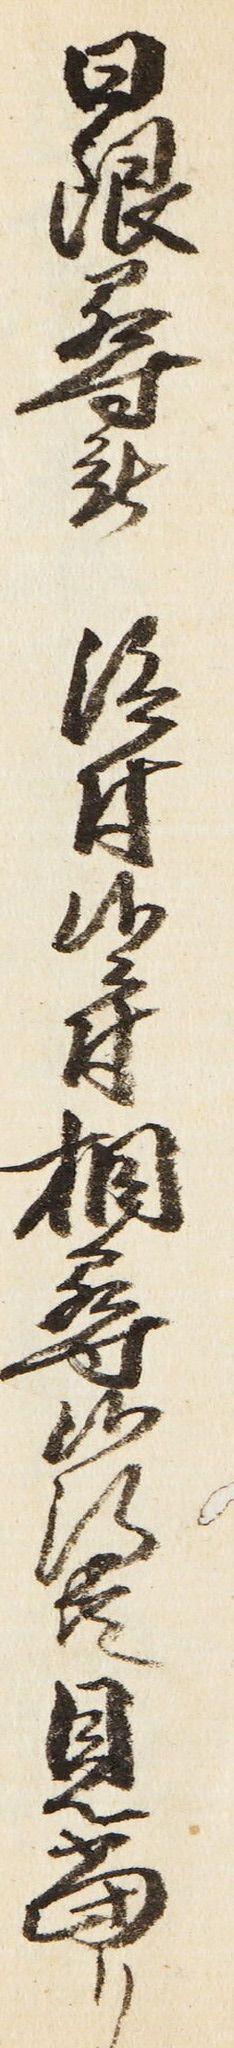日限尋被仰付候ニ付相尋候得共見当り
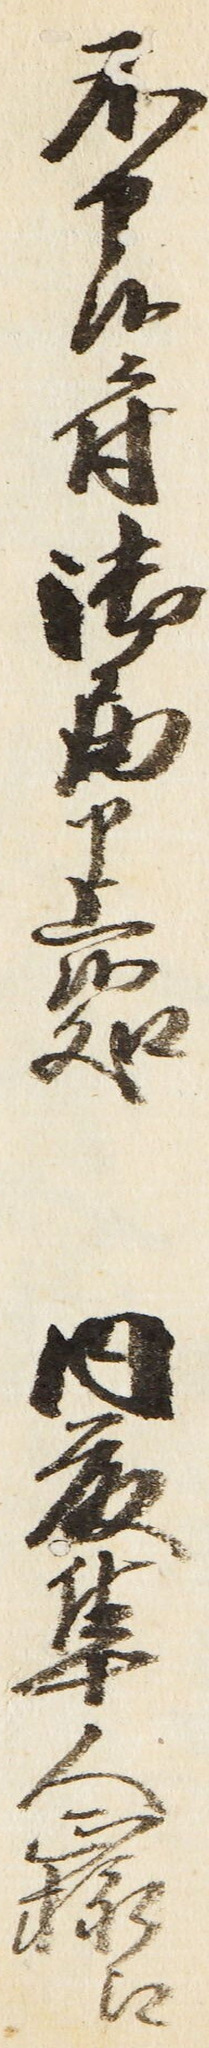不申候ニ付御届申上候処内藤隼人正様江
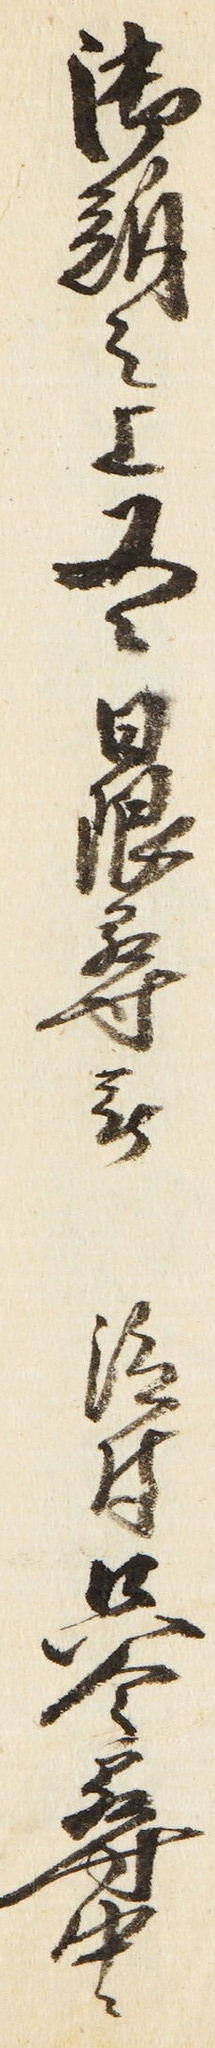御訴之上又々日限尋被仰付只今尋中ニ
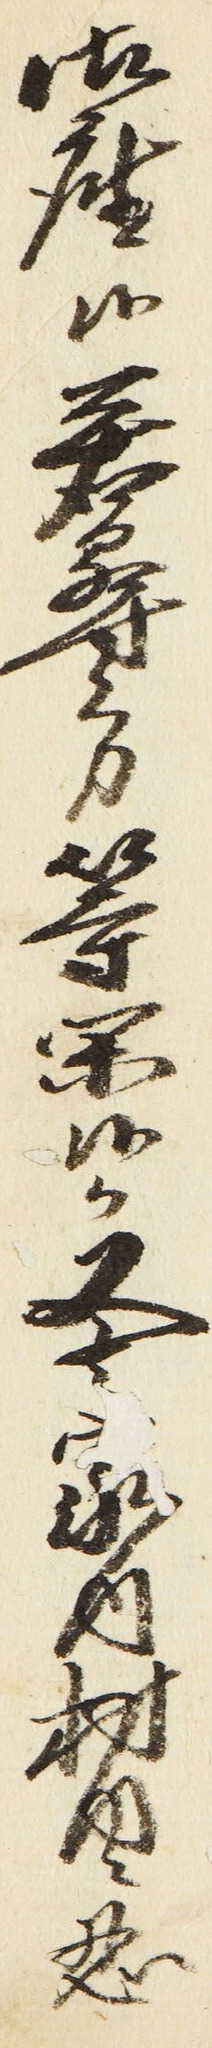御座候若尋方等閑候か又者家内村内ニ忍

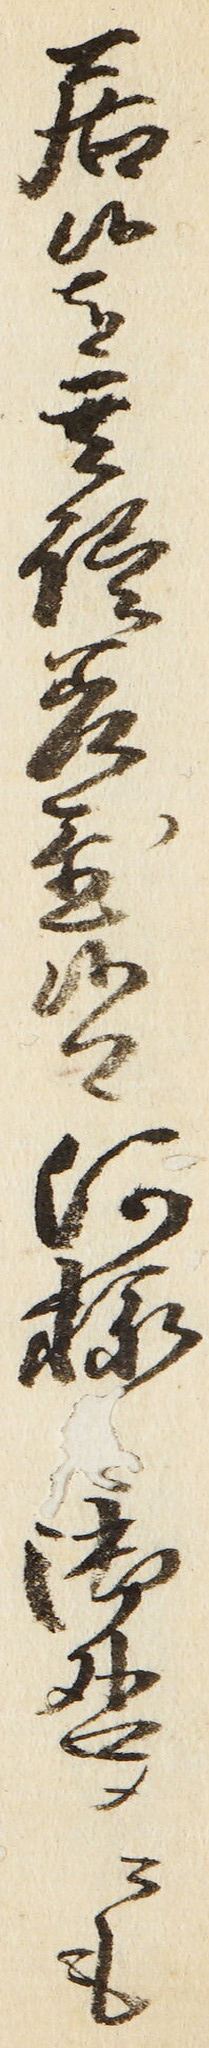居候を其儘差置候ハヽ何様御咎メニも
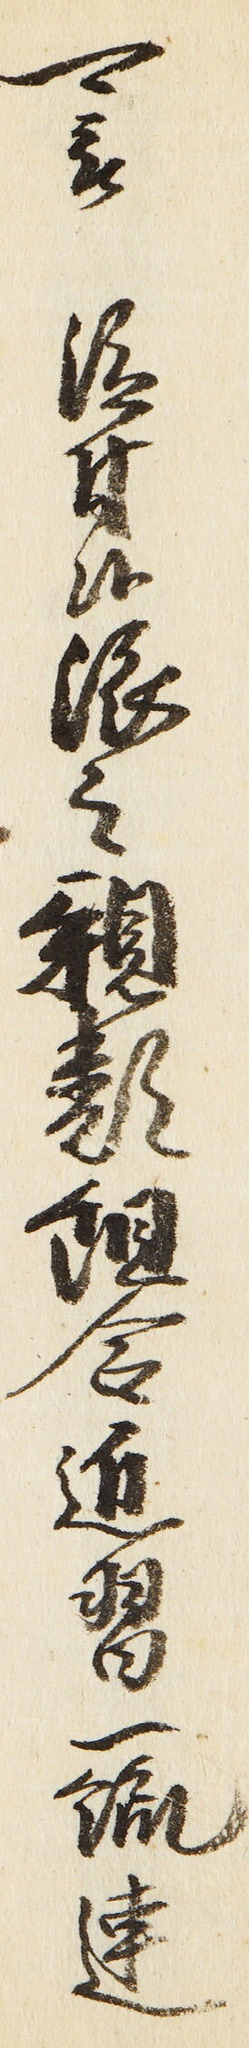可被仰付候依之親類組合近習一統連
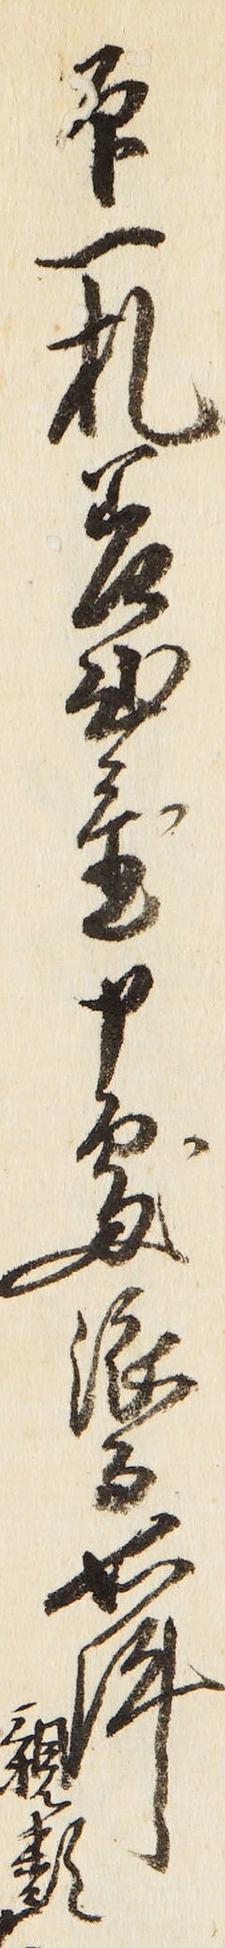印一札差出置申処依而如件
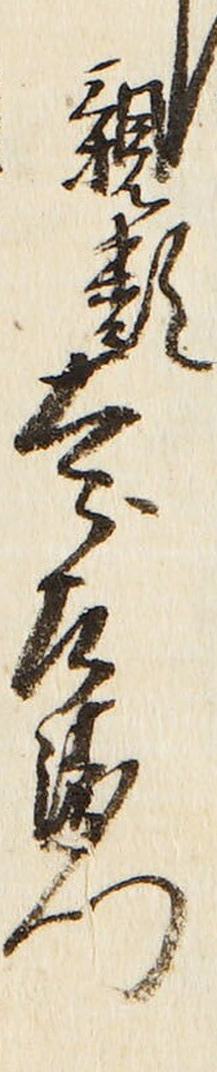同五左衛門
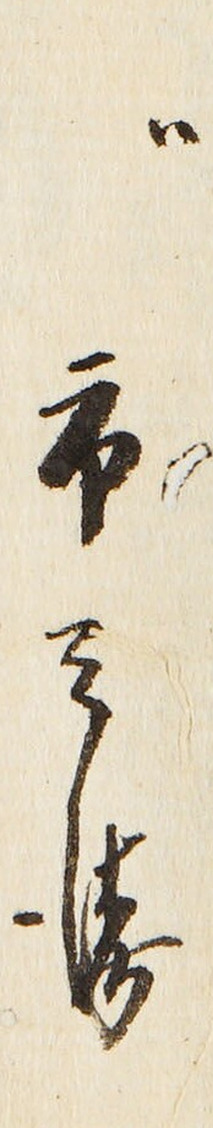同市兵衛
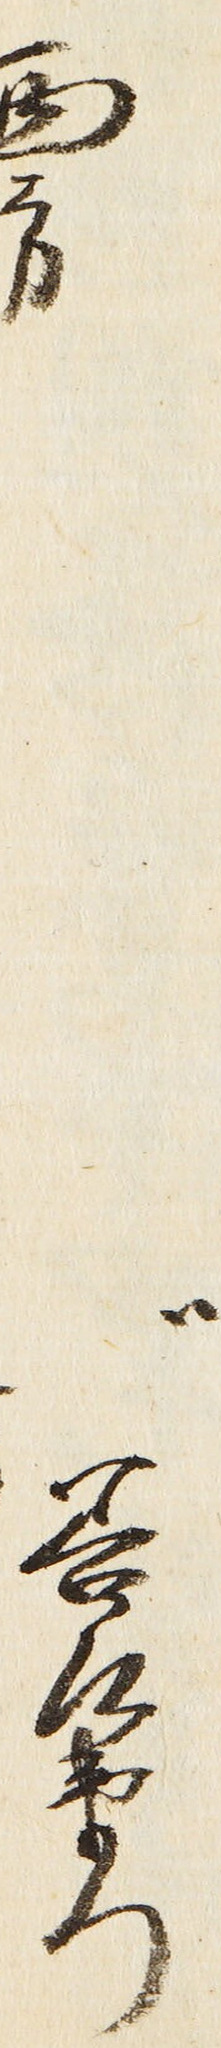同善左衛門
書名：難船一件記録
